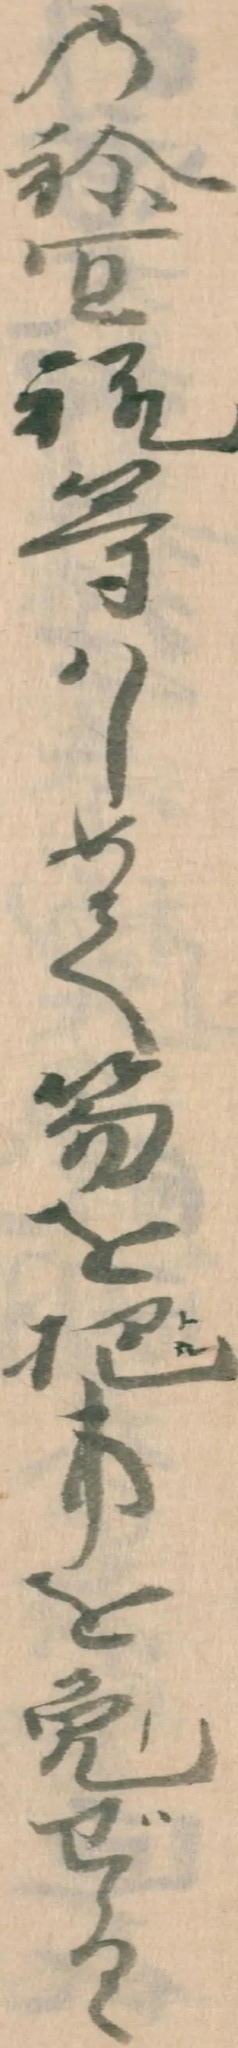の弥宜祝等はしめて笏を把事を免ぜらるゝ
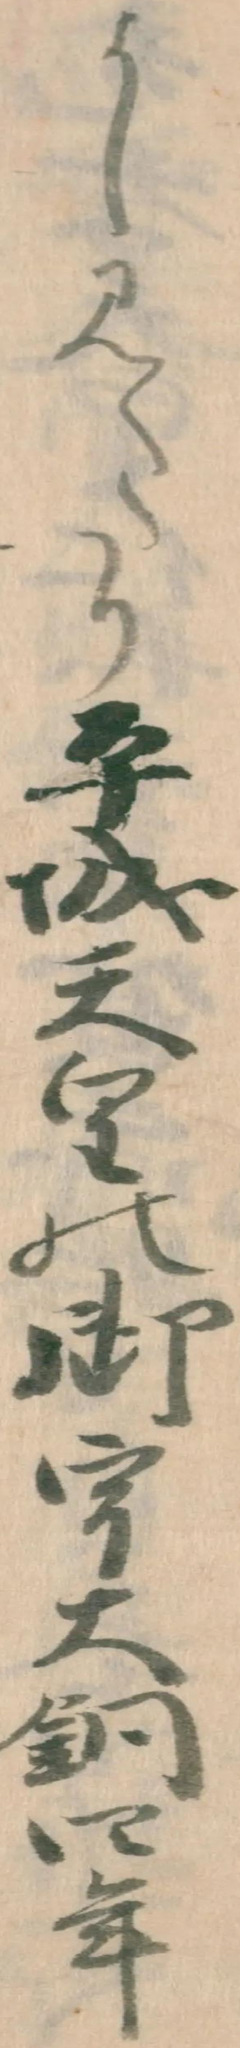よし見えたり平城天皇の御宇大銅四年
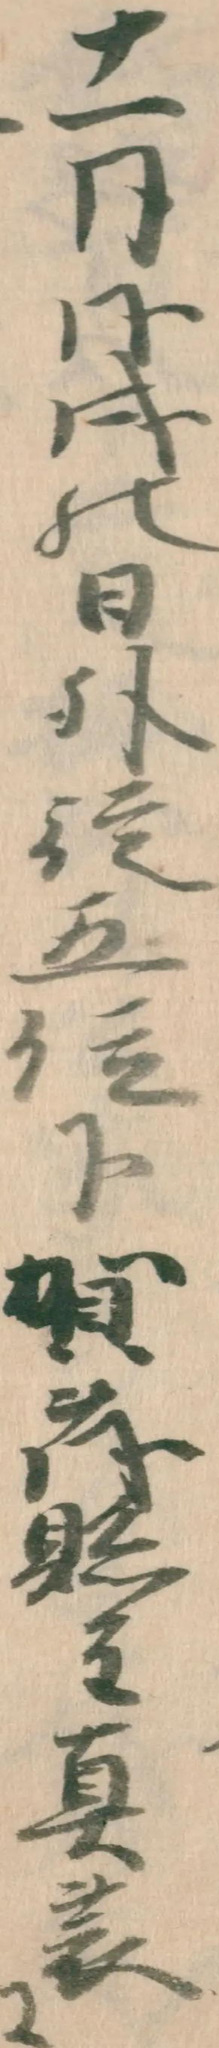十一月戊戌の日外従五位下賀茂県主直簑に
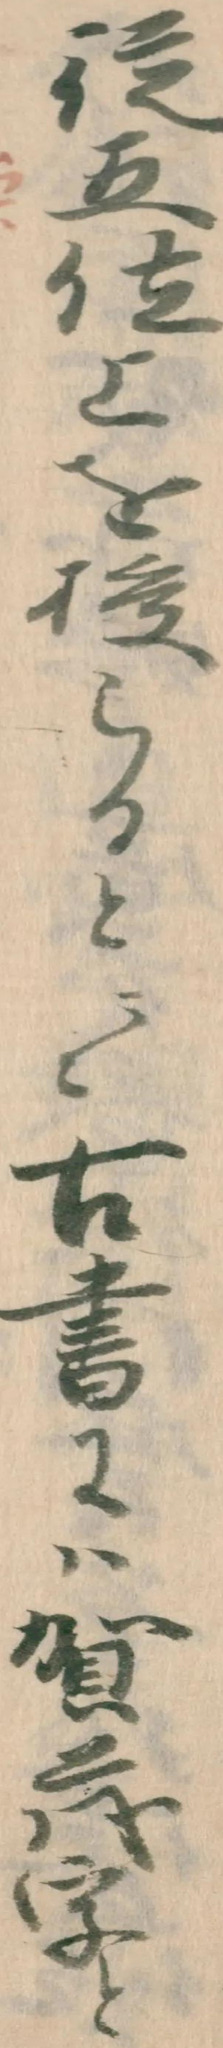従五位上を授らると云々古書には賀茂字と
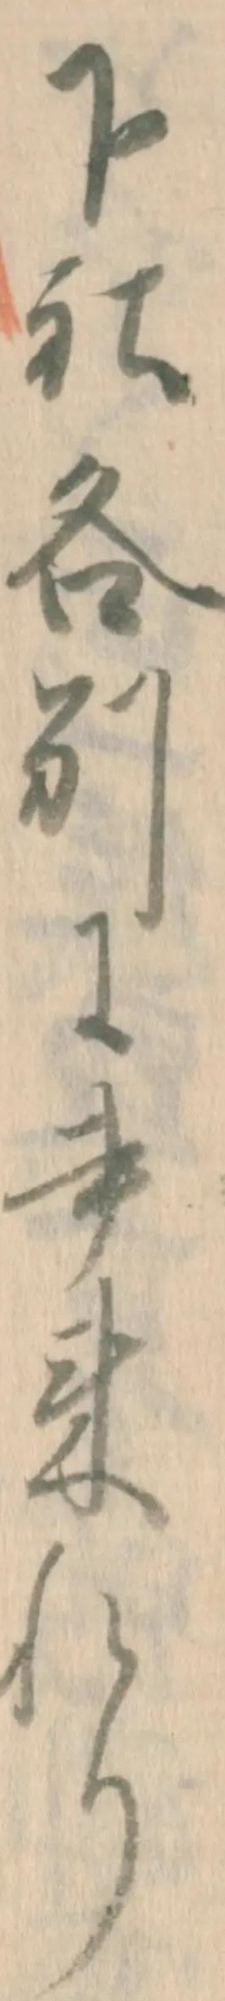下社各別に書来れり
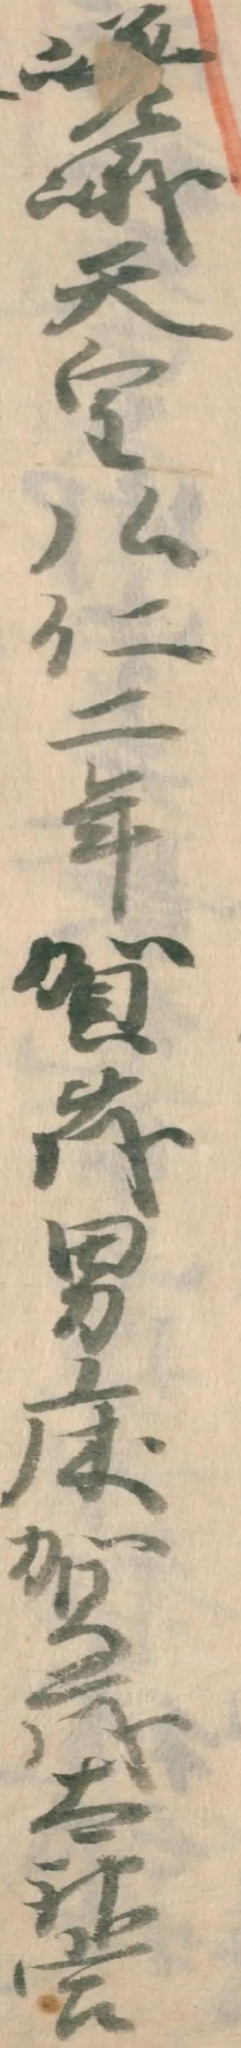嵯峨天皇弘仁二年賀茂男床賀茂太神宮
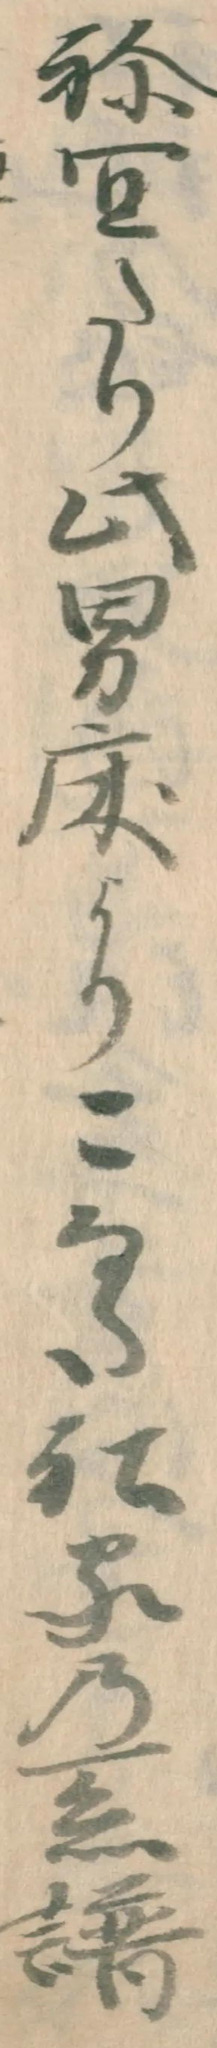称宜たり此男床よりこなた社家の系譜

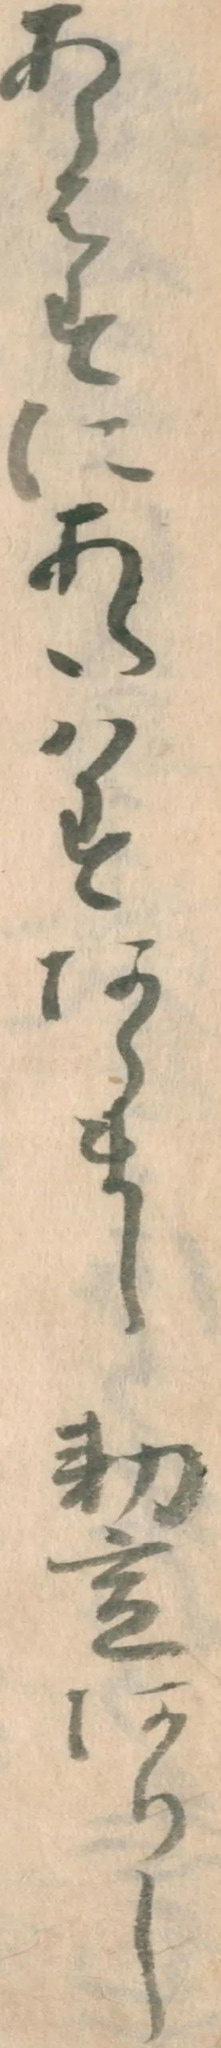あらはすにあたはすあらまし勅宣ありし
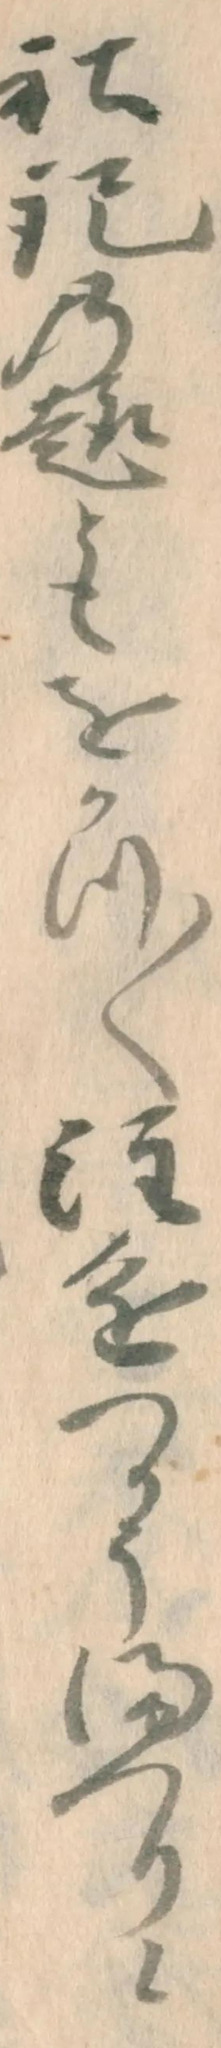社記の趣ともをかつ〳〵注進つかうまつり候
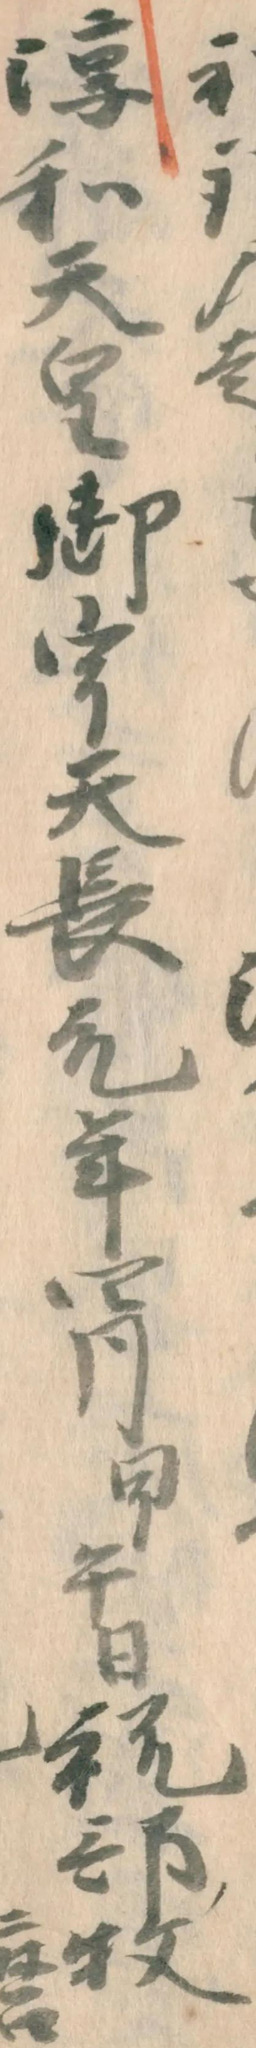淳和天皇御宇天長元年四月甲午日祝部牧麿
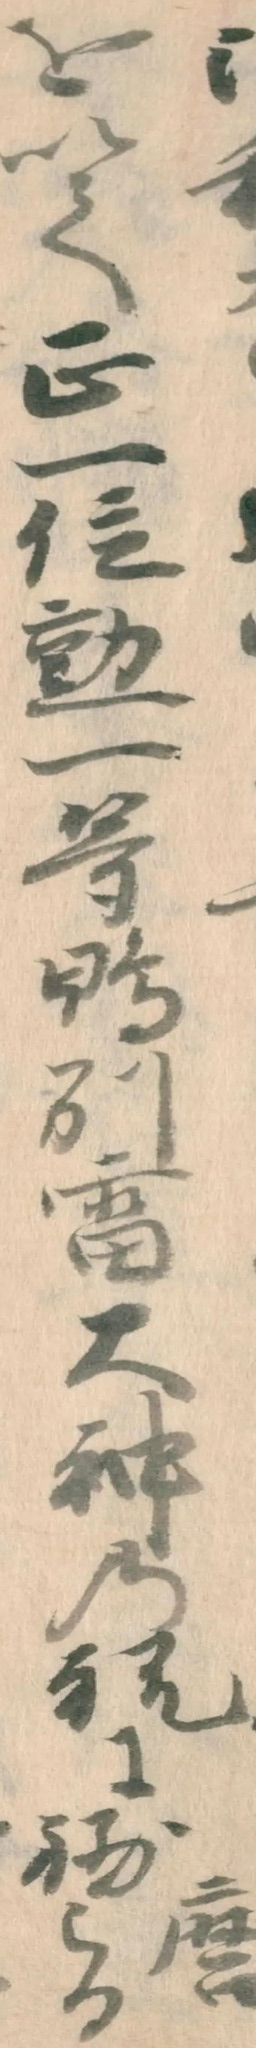を以て正一位勲一等鴨別雷大神の祝に補らる
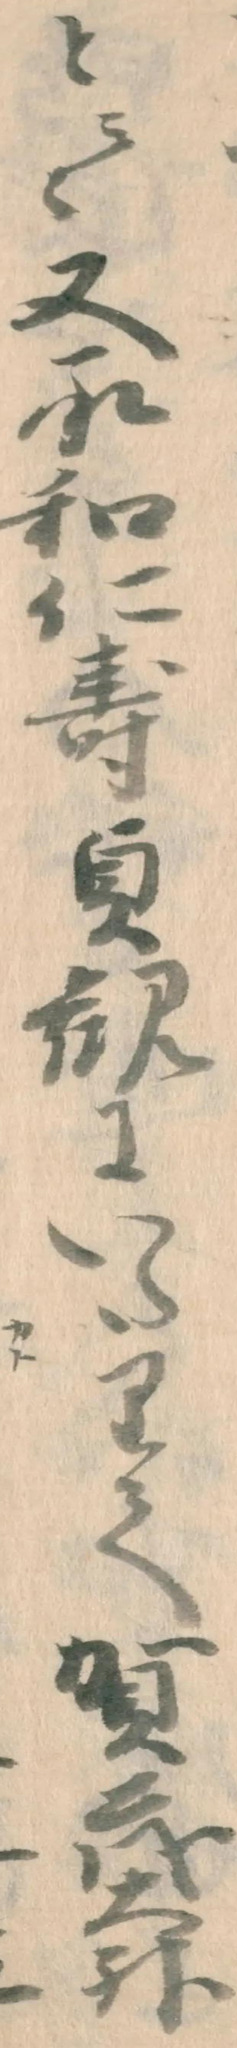と云々又承和仁寿貞観にいたりて賀茂大神
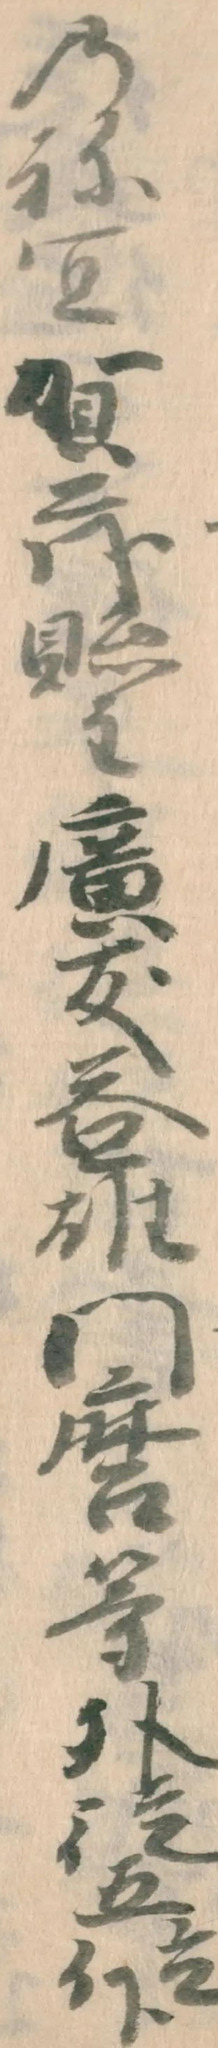の祢宜賀茂県主広友益雄門麿等外従五位下
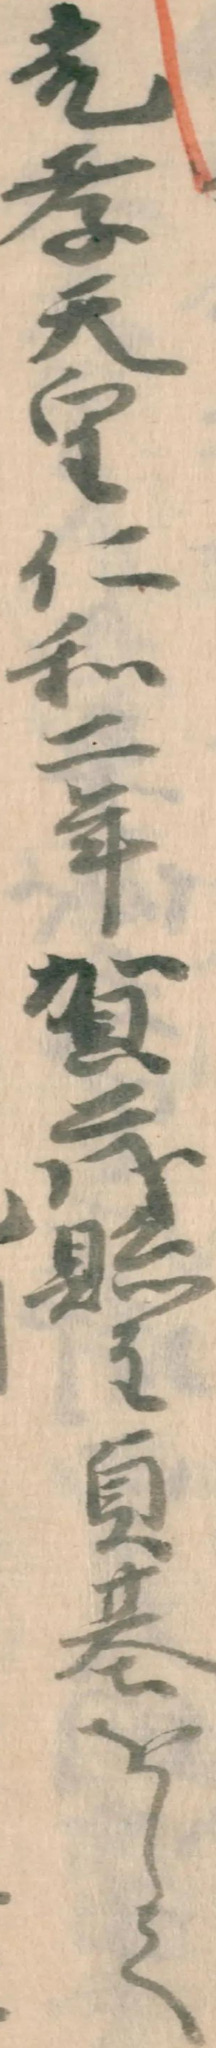光孝天皇仁和二年賀茂県主貞基をして
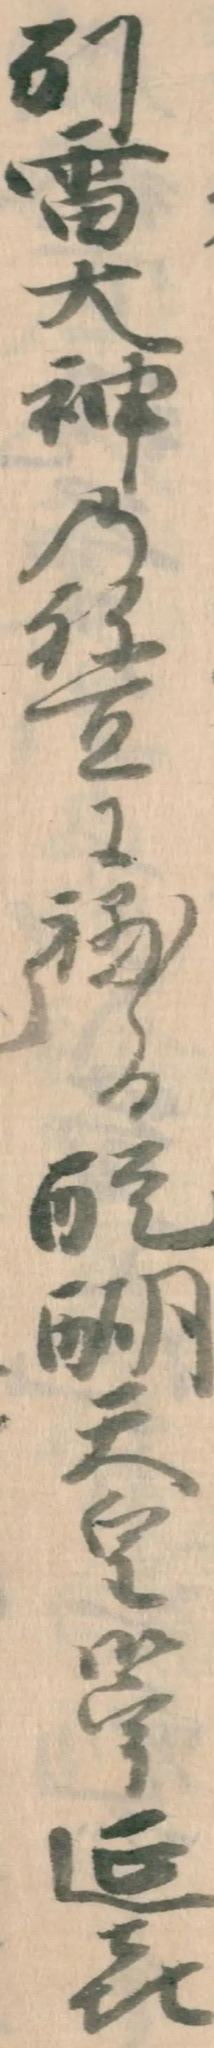別雷大神の称宜に補らる醍醐天皇御宇延喜
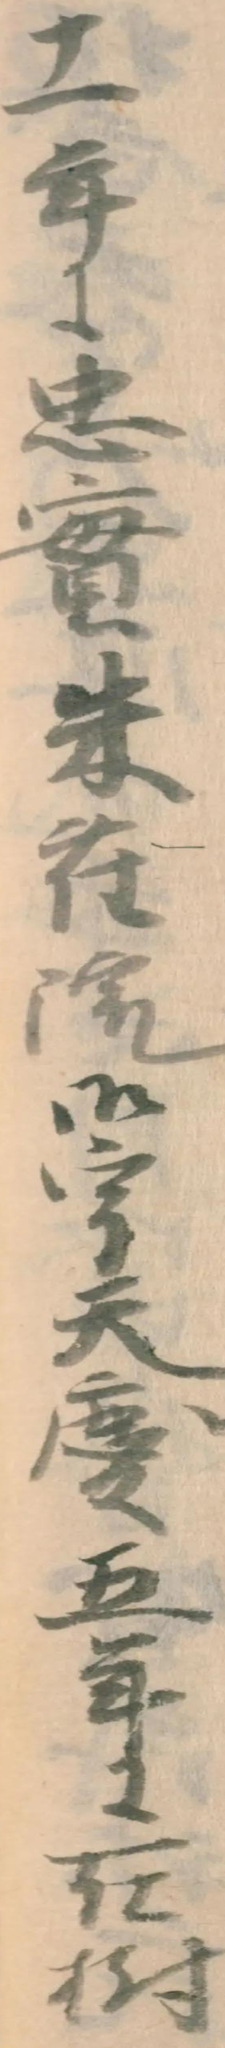十一年に忠実朱雀院御宇天慶五年に在樹
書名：賀茂社記録. 第1冊
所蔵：国立国会図書館 National Diet Library, JAPAN
